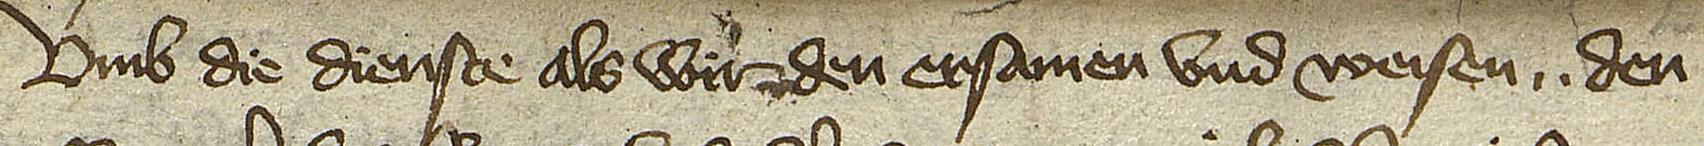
Vmb die dienſte als wir den erſamen vnd weiſen ~ den
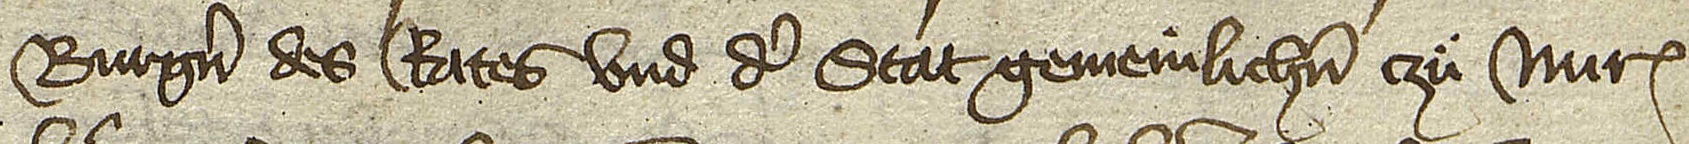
Burgn* des Rates vnd d* Stat gemeinlichn* cʒü Nur*
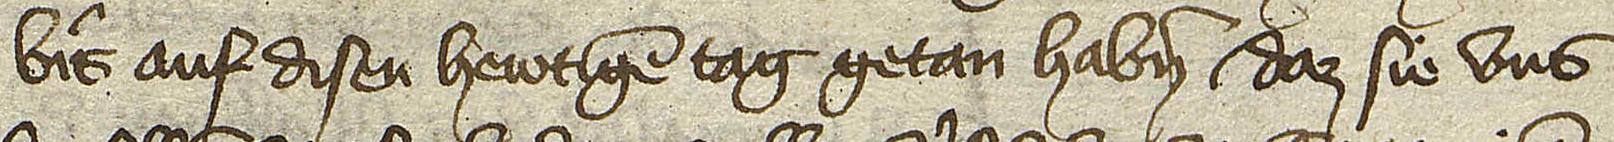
bis auf diſen hewtige* tag getan habn* / daʒ ſie vns
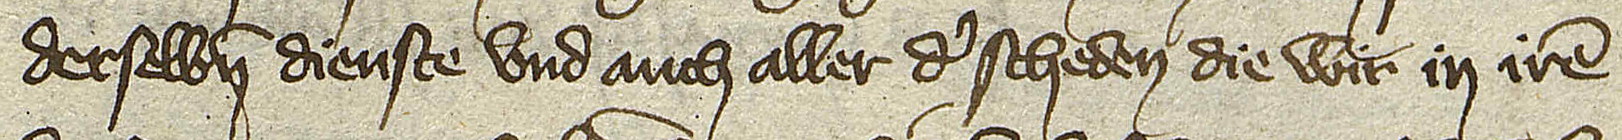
derſelbn* dienſte vnd auch aller d* ſcheden die wir in ire*
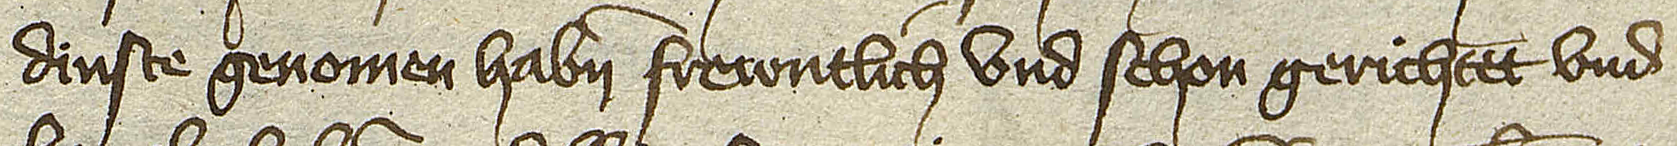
dinſte genomen habn* frewntlich vnd ſchon gerichtet vnd
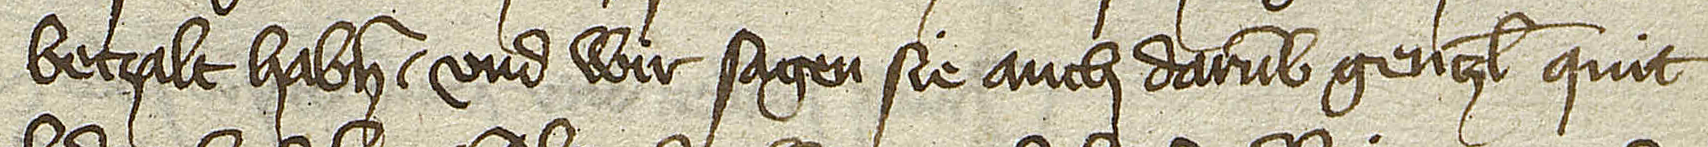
becʒalt habn* / vnd wir ſagen ſie auch darub* gencʒl* quit
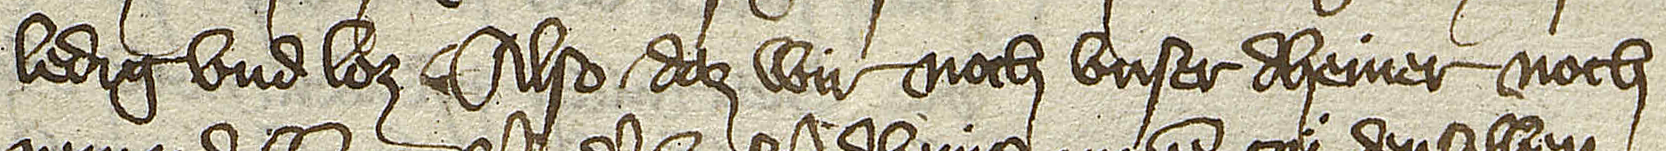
ledig vnd loʒ / Alſo / daʒ wir noch vnſer dheiner noch
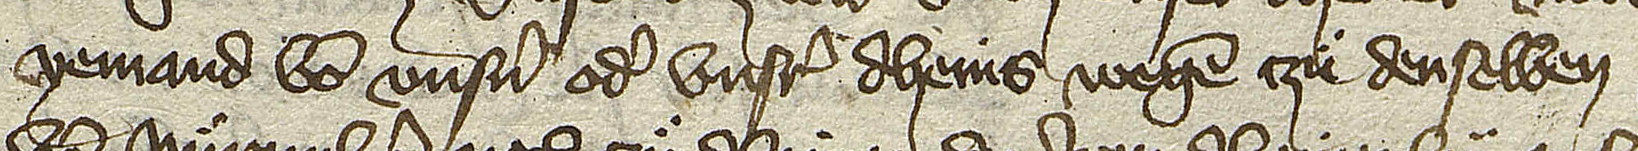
yemand vo* vnſn* od* vnſr* dheins wege* cʒü denſelben
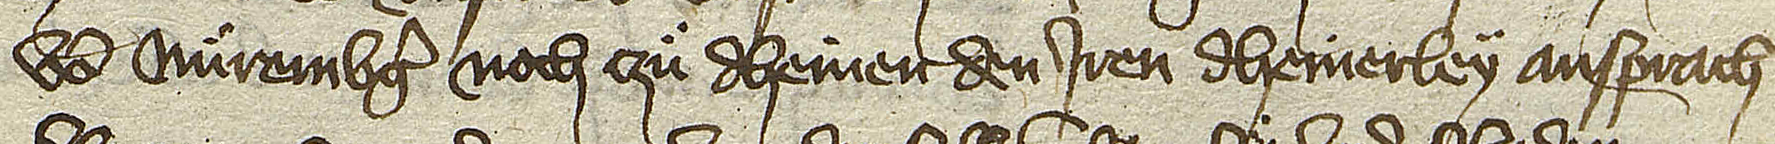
vo* Nürembg* noch cʒü dheinen den Iren dheinerley anſprach
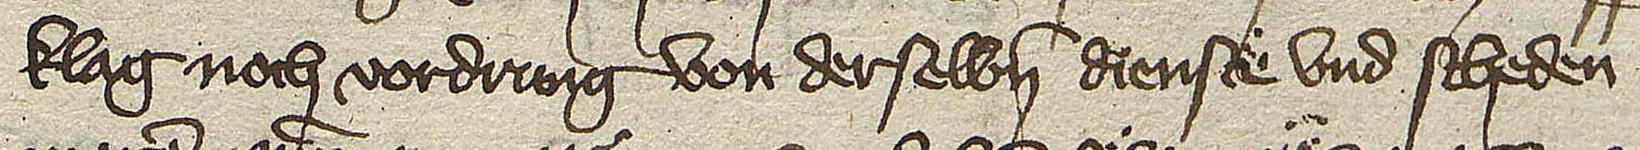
klag noch vordrung von derſelbn* dienſte vnd ſcheden
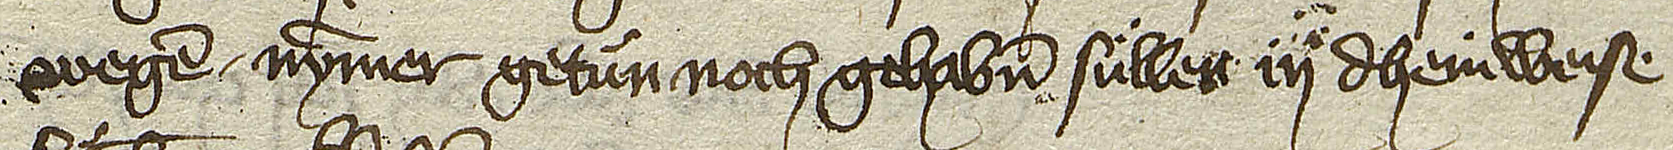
wege* / nym*er getün noch gehabn* ſüllen in dhein weiſe
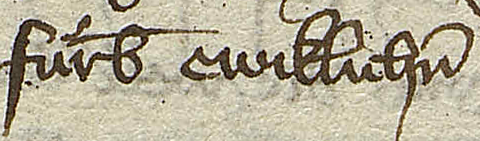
fürb* ewiklichn*
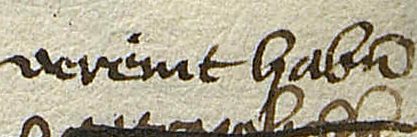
vereint habn*
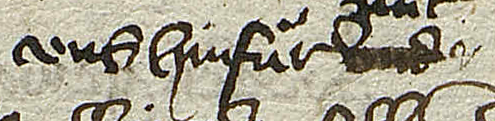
vns hinfür vnd
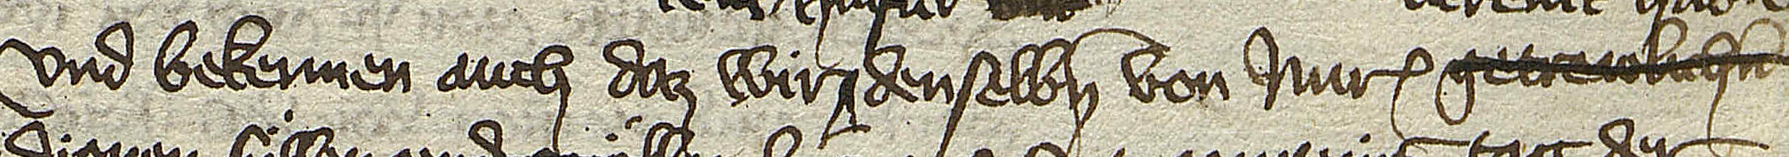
vnd bekennen auch daʒ wir denſelbn* von Nur* getrewlichn*
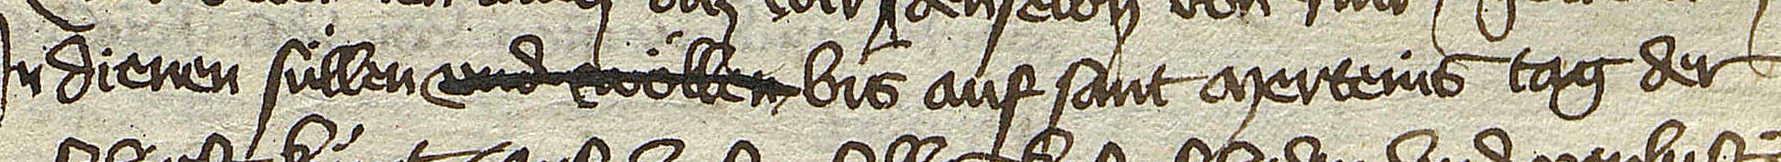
In dienen ſüllen vnd wöllen bis auf ſant Merteins tag der
